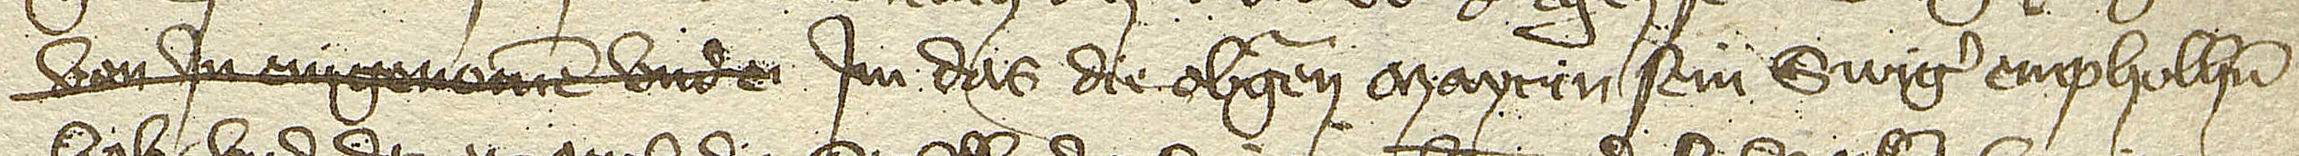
von In eingenome* vnd e Im das die obgen* Mayrin ſein Swig* empholhn*
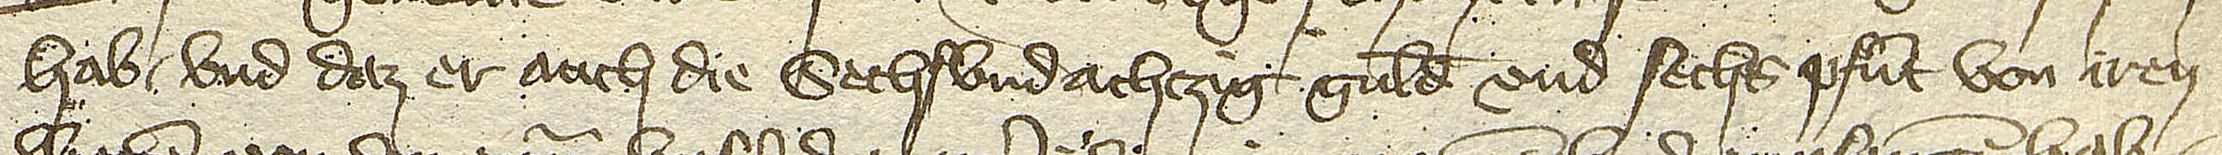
hab / vnd daʒ er auch die Sechſvndachcʒig guld* vnd ſechs pfut* von iren
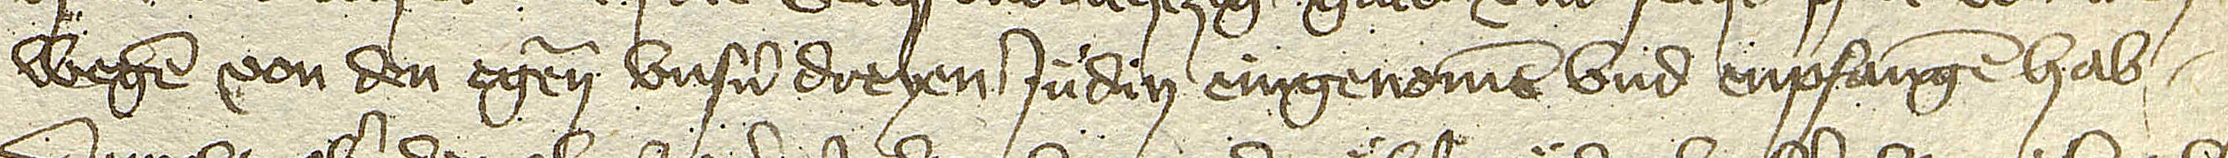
wege* von den egen* vnſn* dreyen Iüdin eingenome* vnd enpfange* hab /
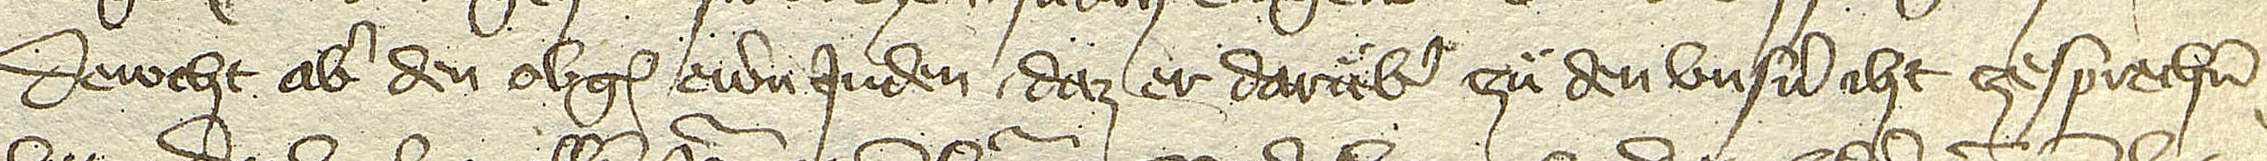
Dewcht ab* den obg* ew*n Iuden / daʒ er darüb* cʒü den vnſn* iht cʒeſprechn*
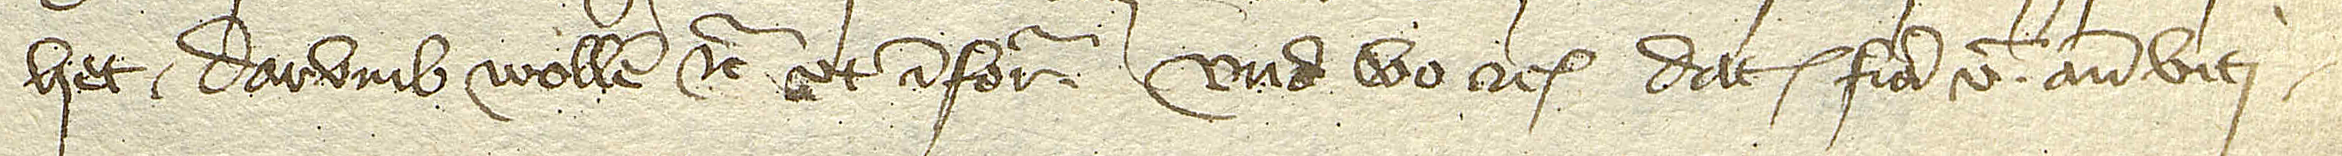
het / Darvmb wolle* ec* vt i* for* vnd wo ec* dat* fia* v* . an* viti /
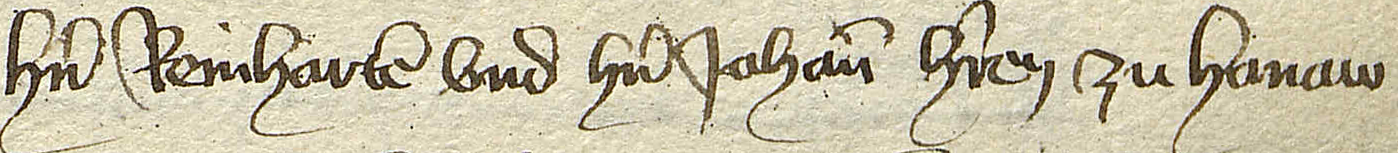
hn* Reinharte* vnd hn* Iohan* hr*en cʒu hanaw
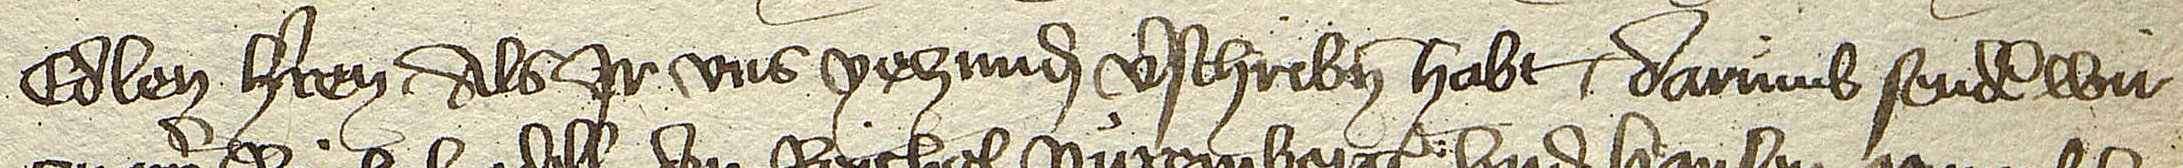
Edlen h*ren / Als Ir vns yecʒund* v*ſchribn* habt / darümb ſend* wir
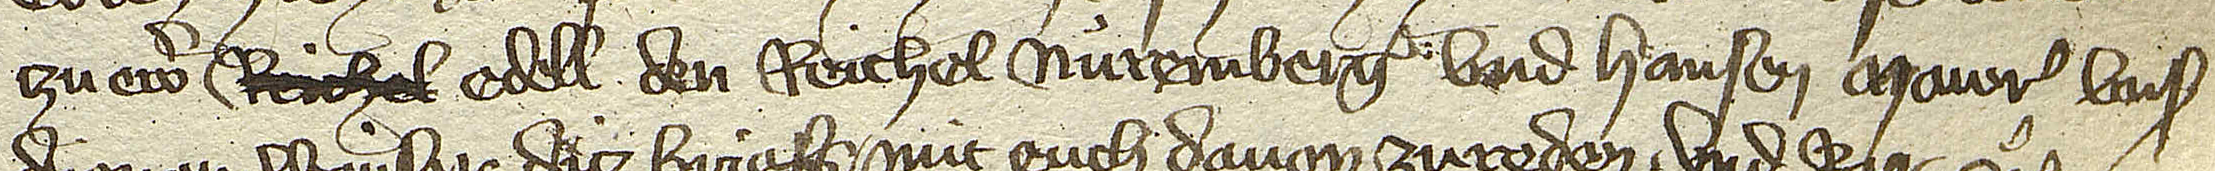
cʒu ew* Reichel edell den Reichel Nüremberg* vnd hanſen Mawr* vnſ*
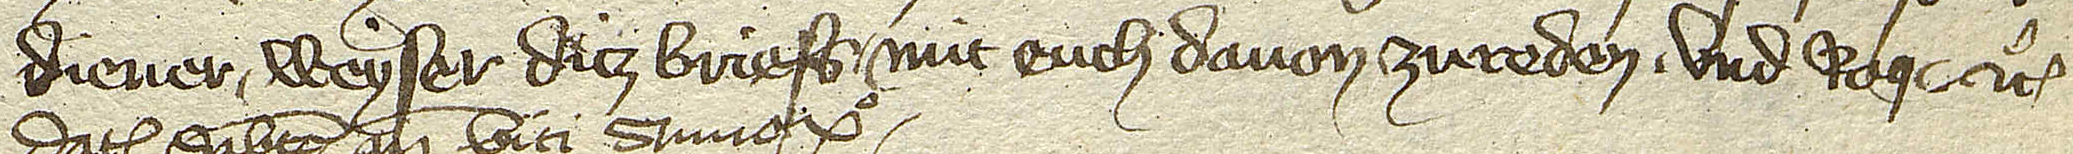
diener / weyſer dicʒ briefs / mit euch dauon cʒureden / vnd Ro* / ec*
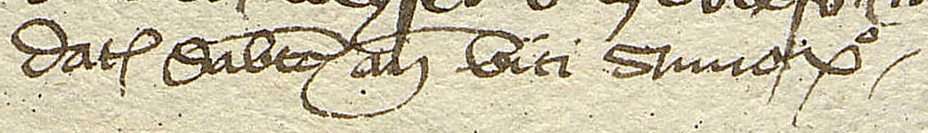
dat* Sabto* an* viti Anno x* /
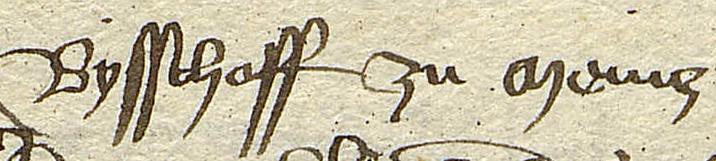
Byſſchoff cʒu Meincʒ
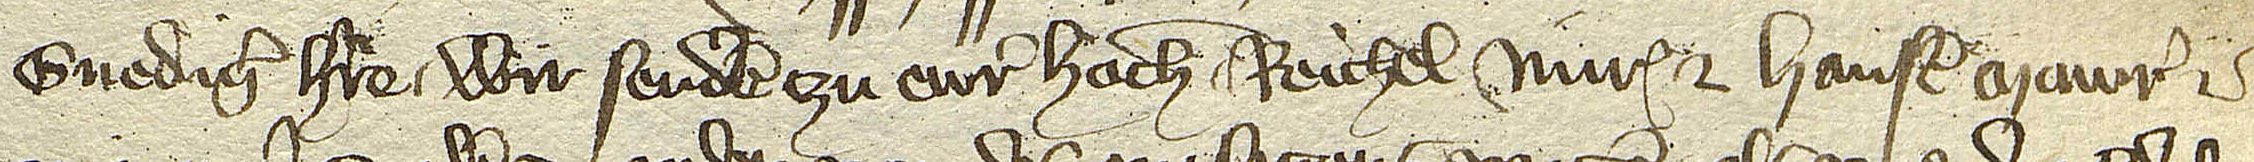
Gnedig* h*re / Wir ſende* cʒu ewr* hoch* / Reichel Nur* @ hanſe* Mawr* ec*
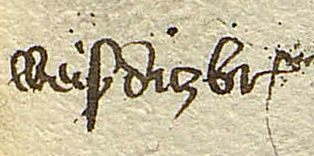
weiſ* dicʒ br*
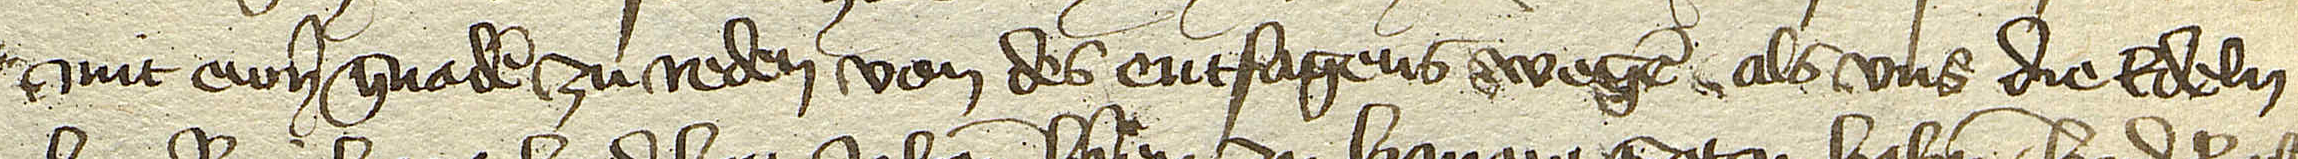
mit ewn* gnad* cʒu reden von des entſagens wege* als vns die Edeln
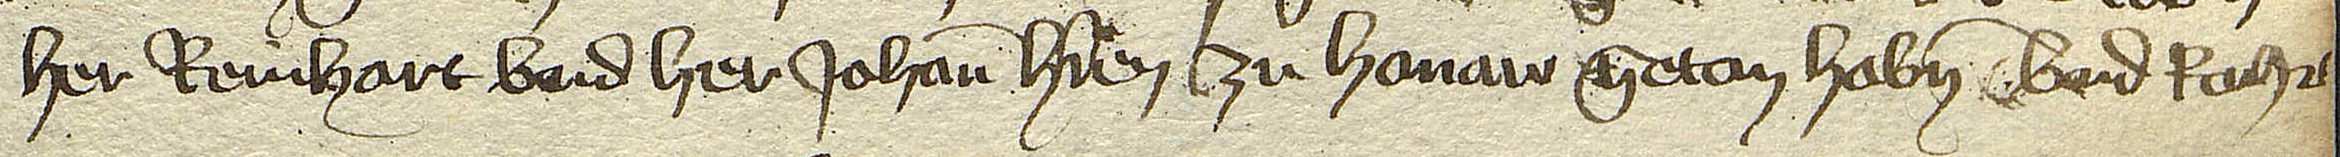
her Reinhart vnd her Iohan hr*en cʒu hanaw getan habn* / vnd Ro* ec*
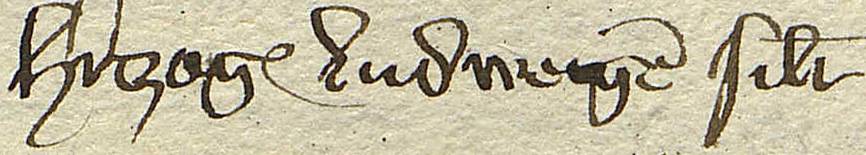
hr*cʒog* Ludweige* ſilr*
